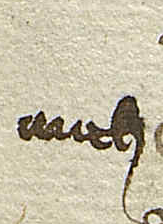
auch
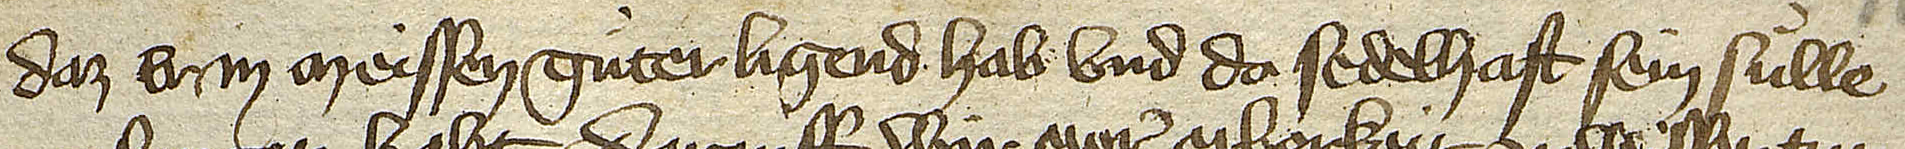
daʒ Er in Meiſſen güter ligend hab vnd da ſedelhaft ſein ſülle
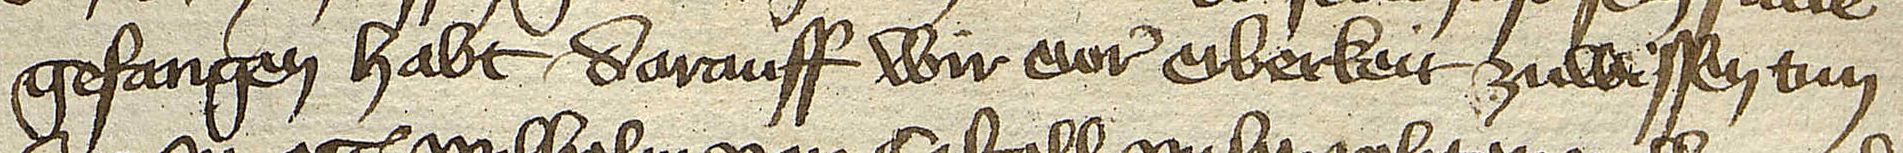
gefangen habt / Darauff wir ewr* erberk* ʒuwiſſen tun
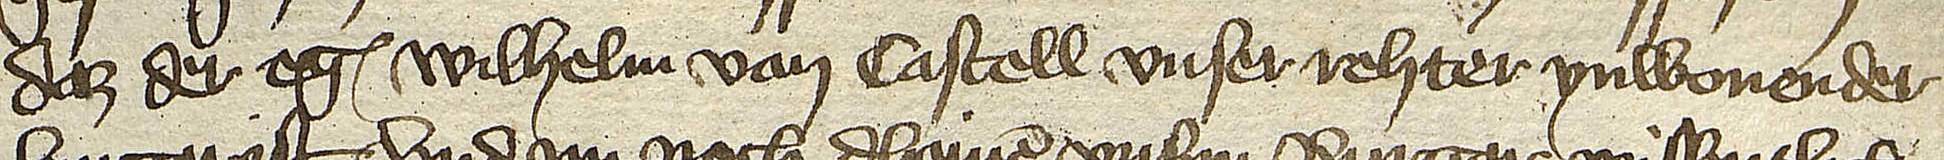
daʒ der eg* wilhelm von Caſtell vnſer rehter ynwonender
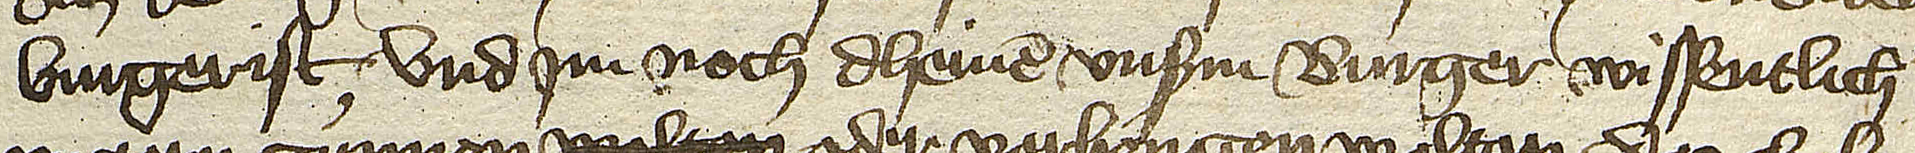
burgeriſt / Vnd Im noch dheine* vnſ*m Burger wiſſentlich
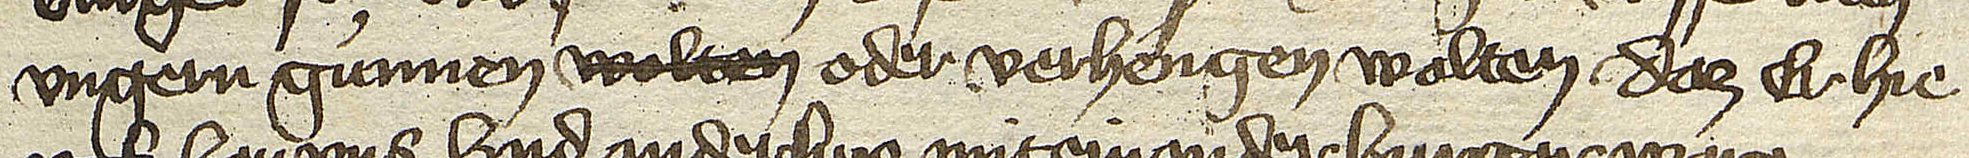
vngern günnen wolten oder verhengen wolten / daʒ Er hie
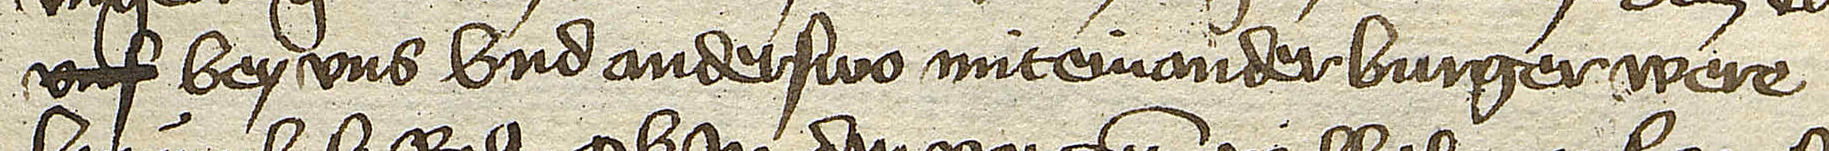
vnſ bey vns vnd anderſwo miteinander burger were
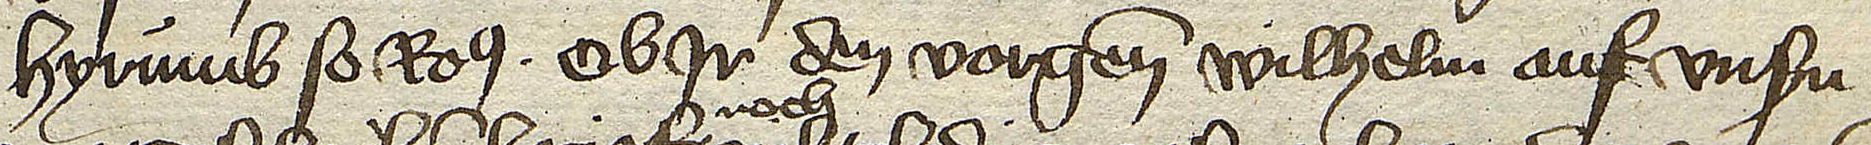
hyrümb ſo Ro* . Ob Ir den vorgen* wilhelm auf vnſ*n
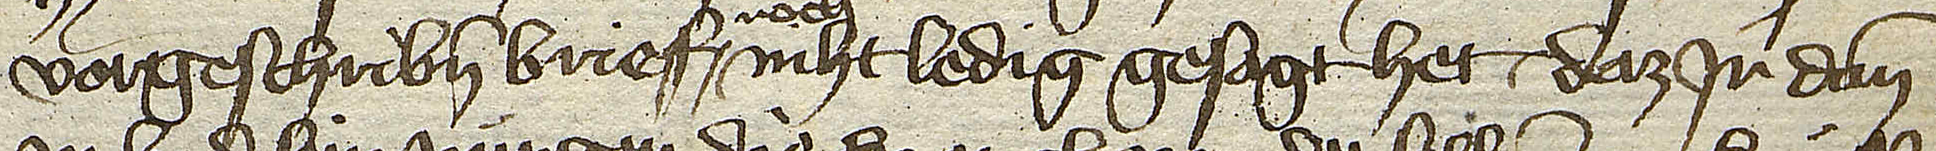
vorgeſchribn* brief niht ledig geſagt het / daʒ Ir dan*
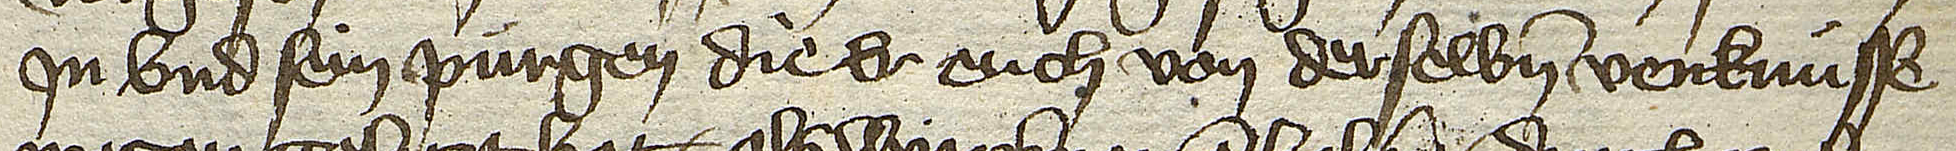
In vnd ſein pürgen die Er euch von derſelbn* venknüſſe
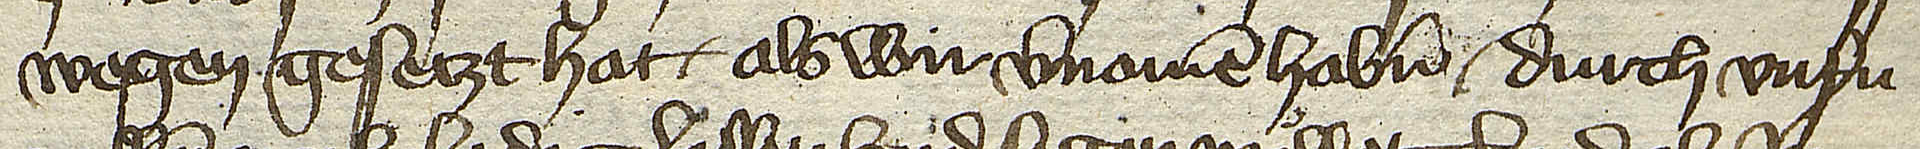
wegen geſecʒt hat / als wir v*nome* habn* / durch vnſ*n
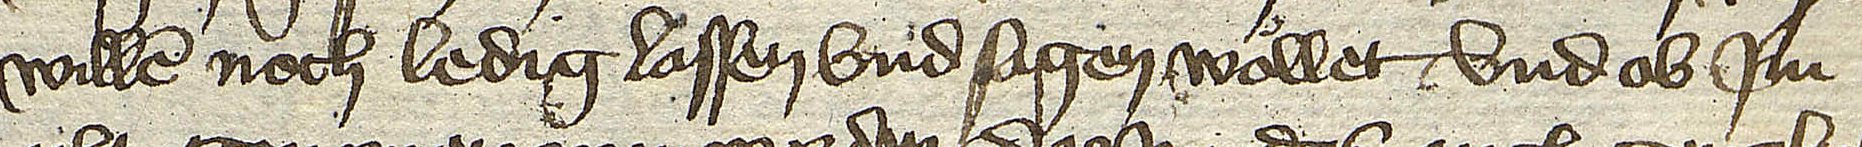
wille* noch ledig laſſen vnd ſagen wöllet / vnd ob Im
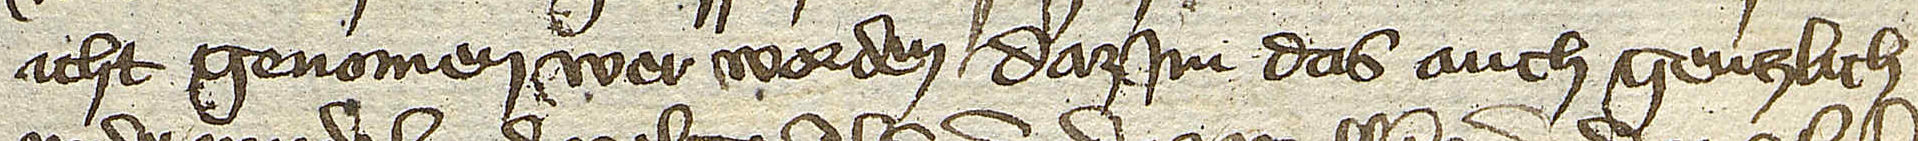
icht genomen wer worden / daʒ Im das auch gencʒlich
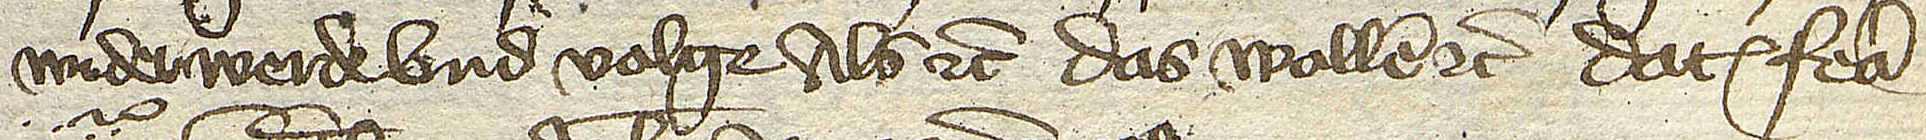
widerwerde vnd volge Als ec* das wolle* ec* dat* fea*
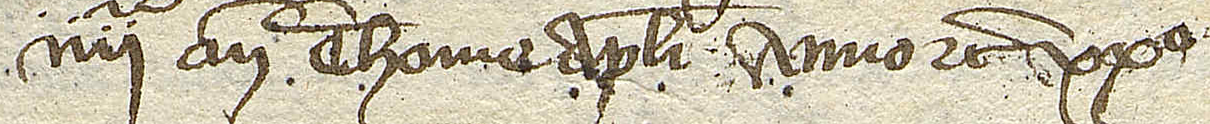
iiii* an* Thome Apli* Anno ec* xx*
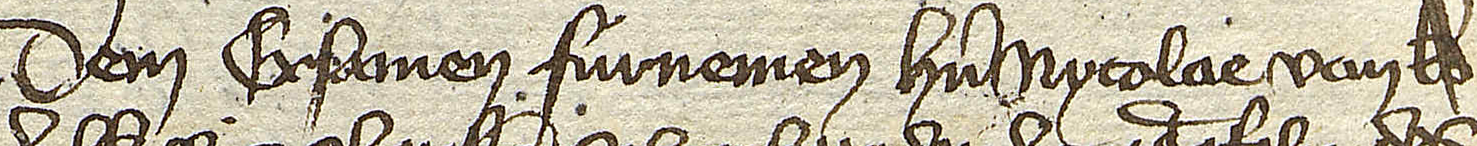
Dem Erſamen fürnemen hn* Nycolae von k
